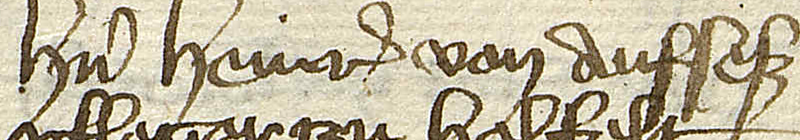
H*n Heinr* von Aufſeſʒ
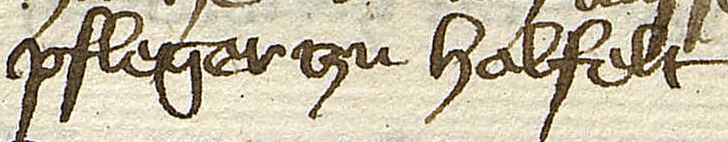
pfleger cʒu holfelt
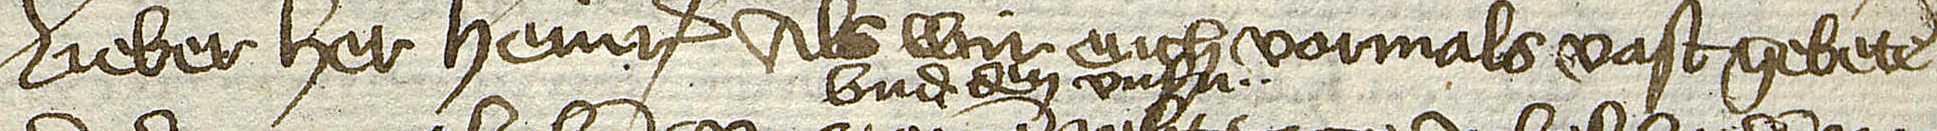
Lieber her heinr Als wir euch vormals vaſt gebete*
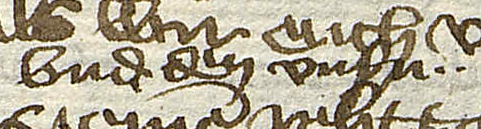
vnd den vnſ*n
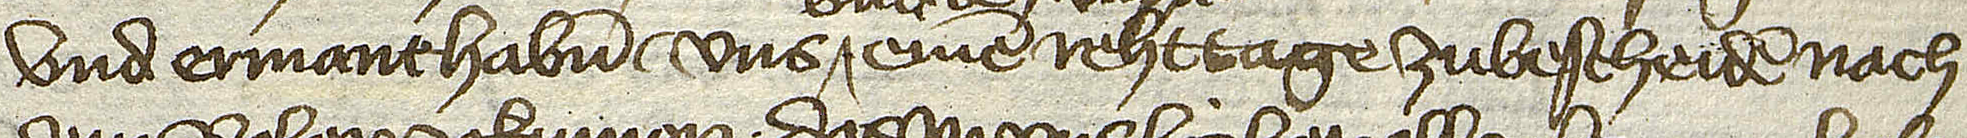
vnd ermant hab*n / vns ew*e rehttage ʒubeſcheid* nach
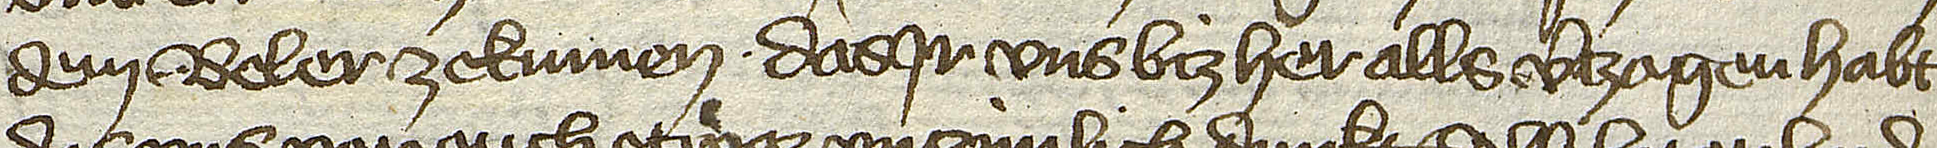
dem ~ Beler cʒekumen . das Ir vns biʒ her alls v*ʒogen habt
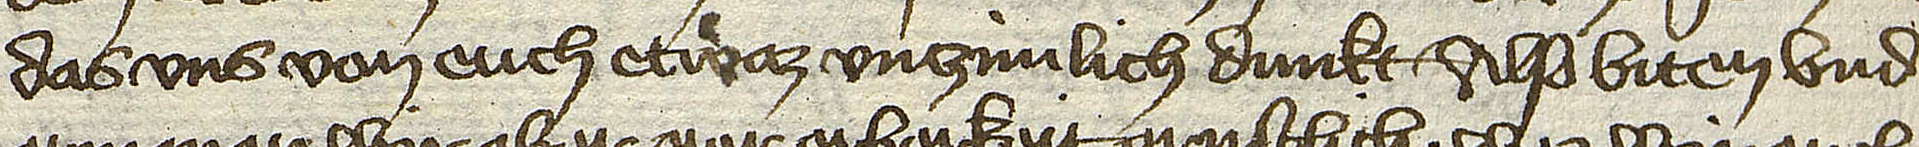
das vns von euch etwaʒ vncʒimlich dunkt / Alſo biten vnd
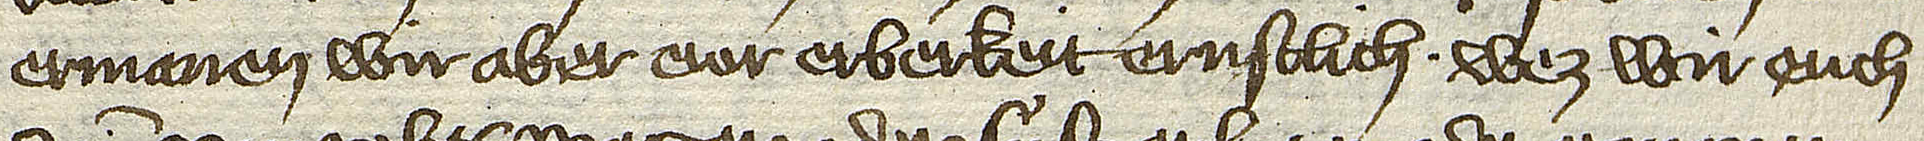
ermanen wir aber ewr erberkeit ernſtlich . weʒ wir euch
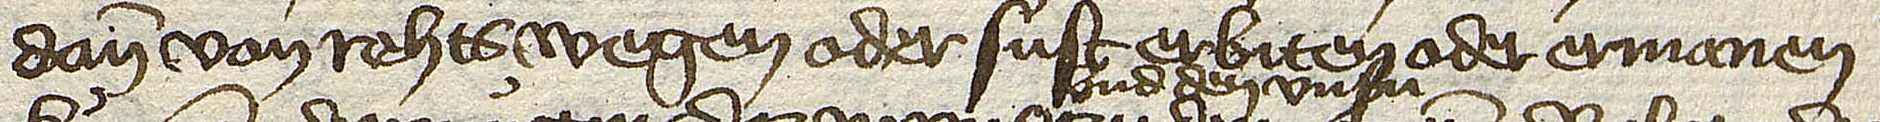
dan* von rehts wegen oder ſu*ſt erbiten oder ermanen
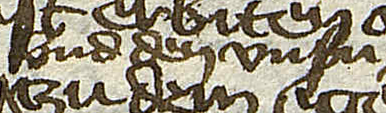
vnd den vnſ*n
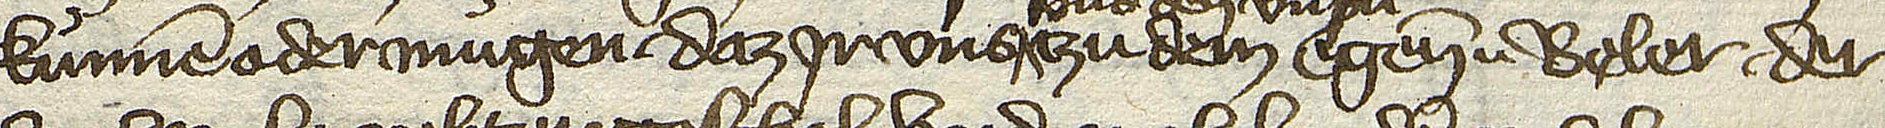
künne* oder mügen / daʒ Ir vns cʒu dem egen* ~ Behler / der
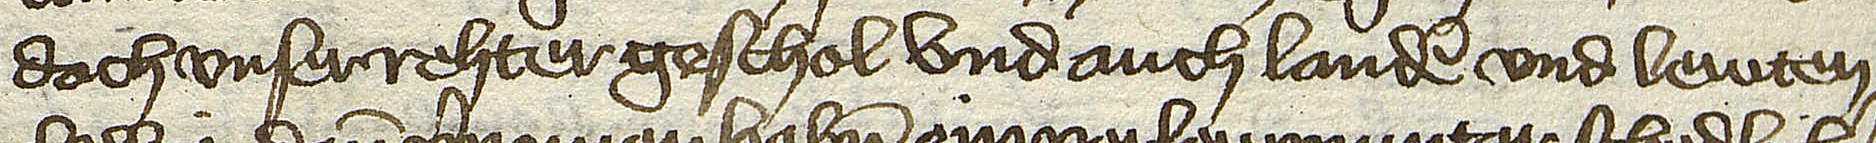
doch vnſer rehter geſchol vnd auch land* vnd lewten
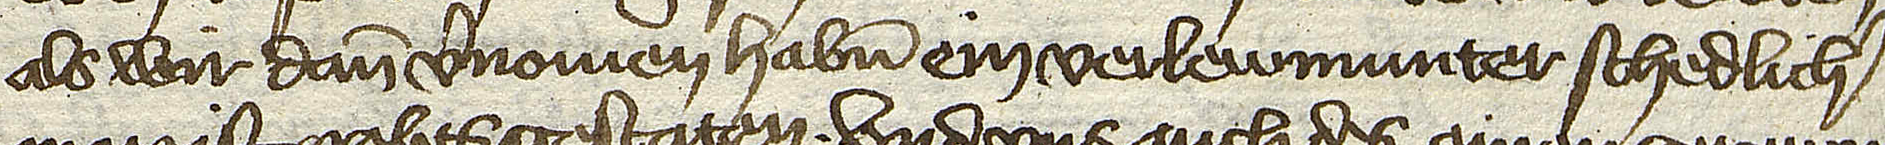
als wir dan* v*nomen hab*n ein verlewmunter ſchedlich*
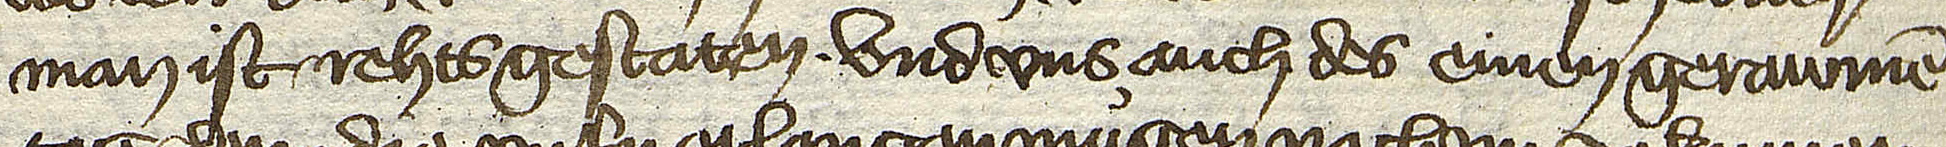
man iſt / rehts geſtaten . vnd vns auch des einen gerawme*
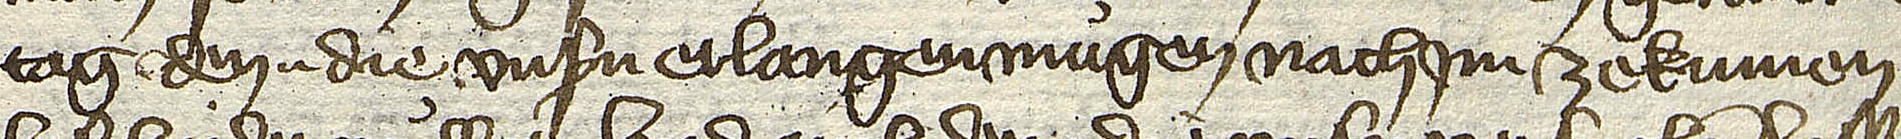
tag / den ~ die vnſ*n erlangen mügen nach Im cʒekumen
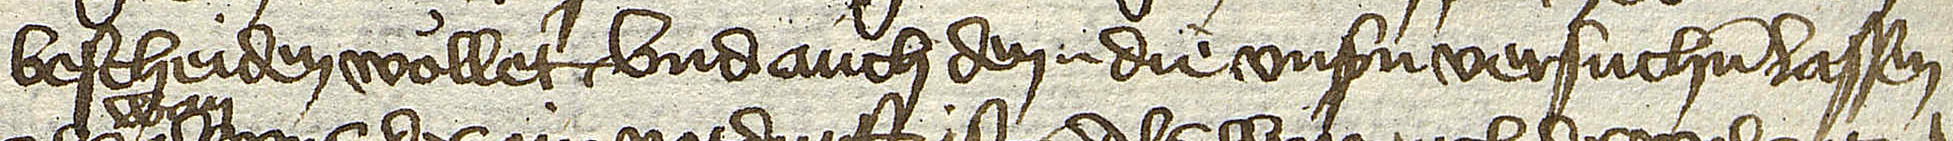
beſcheiden wöllet / vnd auch den ~ die vnſ*n verſuch*n laſſen
